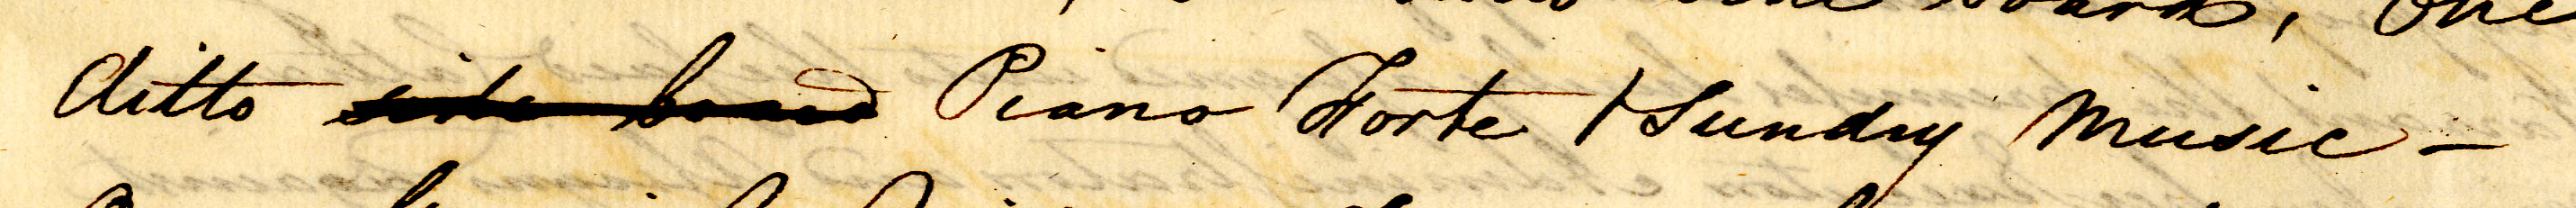ditto Piano Forte & sundry music-
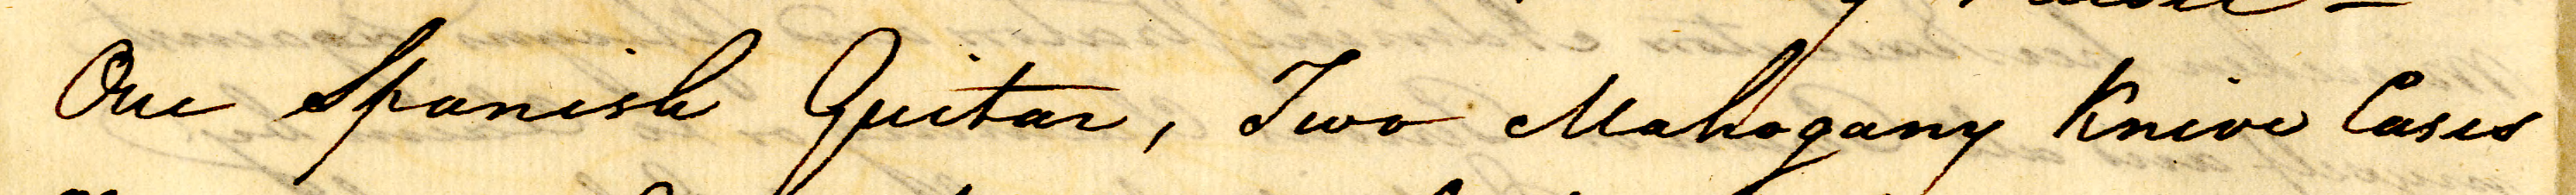One Spanish Guitar, Two Mahogany Knive Cases
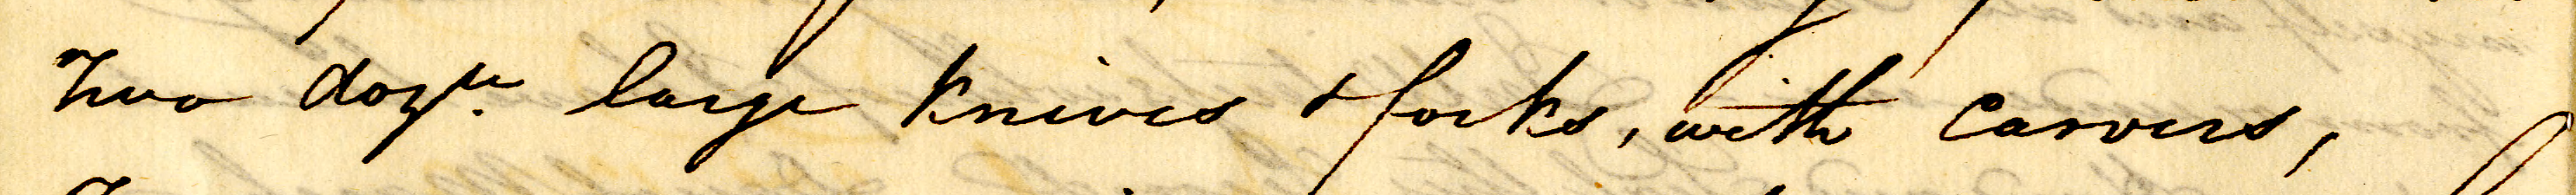Two doz^n. large Knives & forks, with carvers,
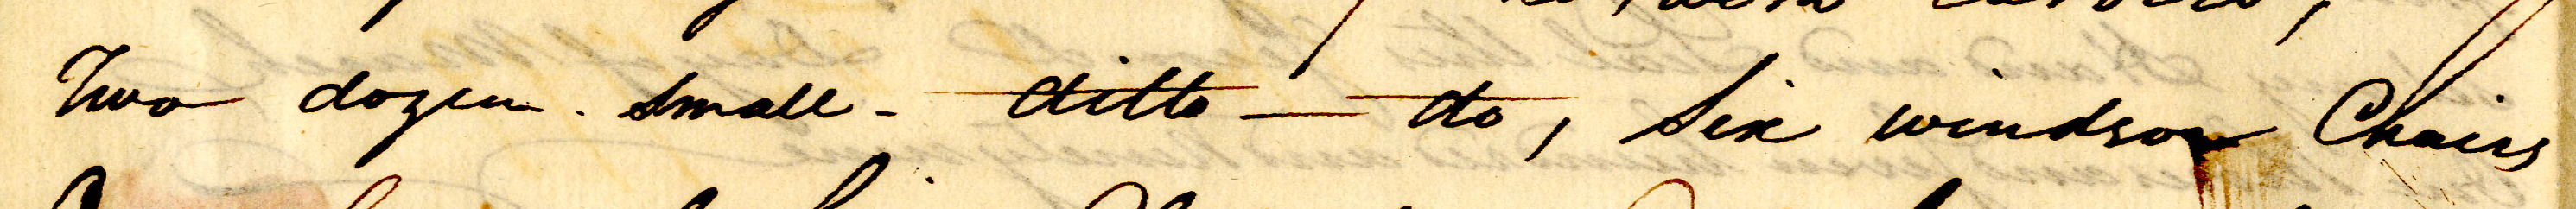Two dozen. small. ditto-do, six windsor Chairs
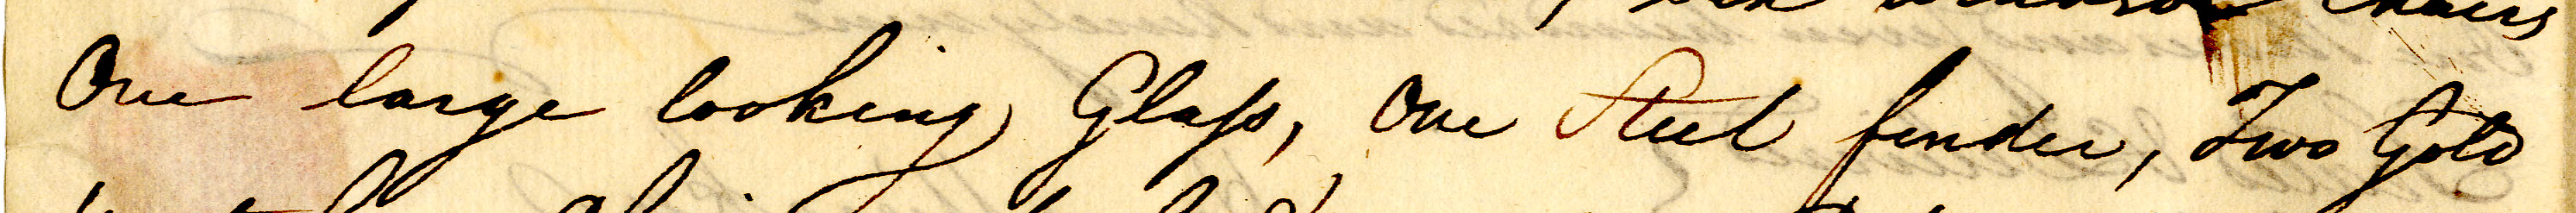One large looking Glass, one Steel fender, Two Gold
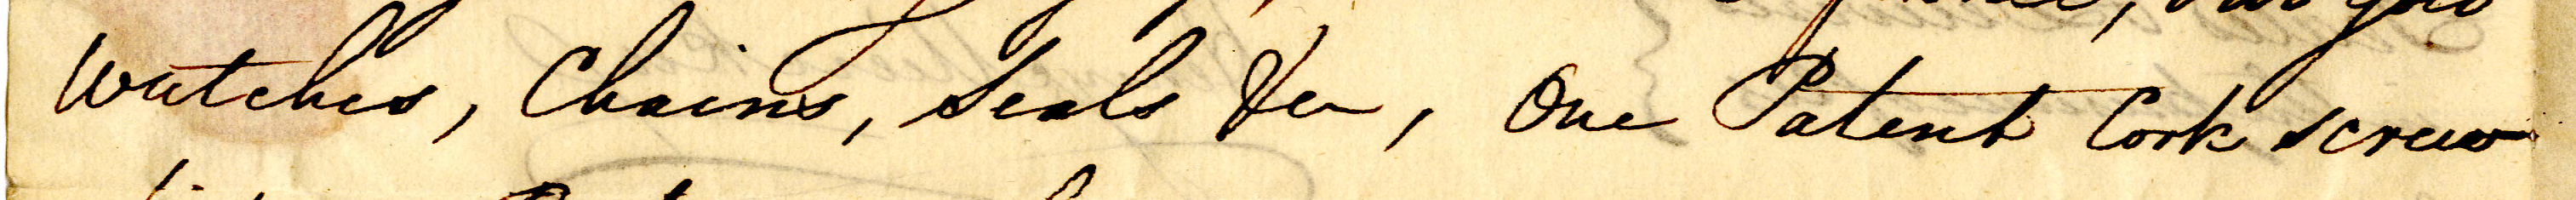watches, Chains, seals &c, one Patent cork screw
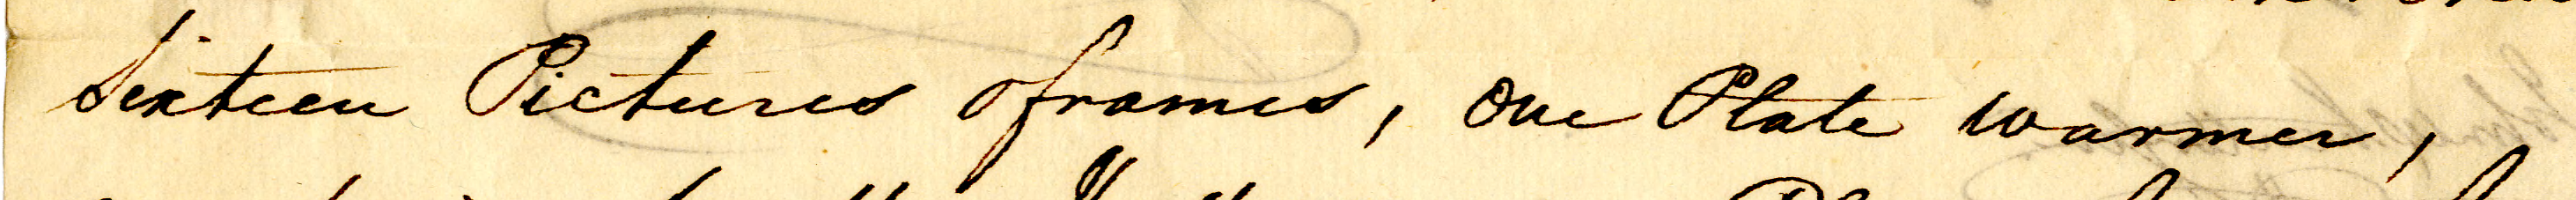Sixteen Pictures & frames, one Plate warmer,
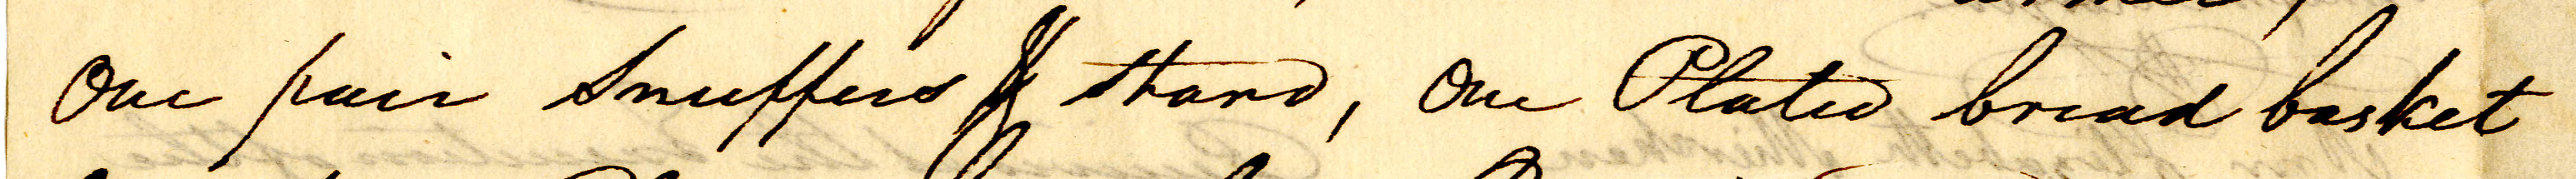one pair snuffers & stand, one Plated bread basket
